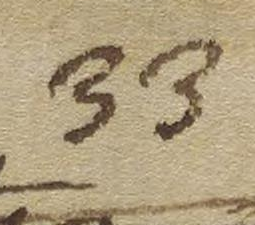33
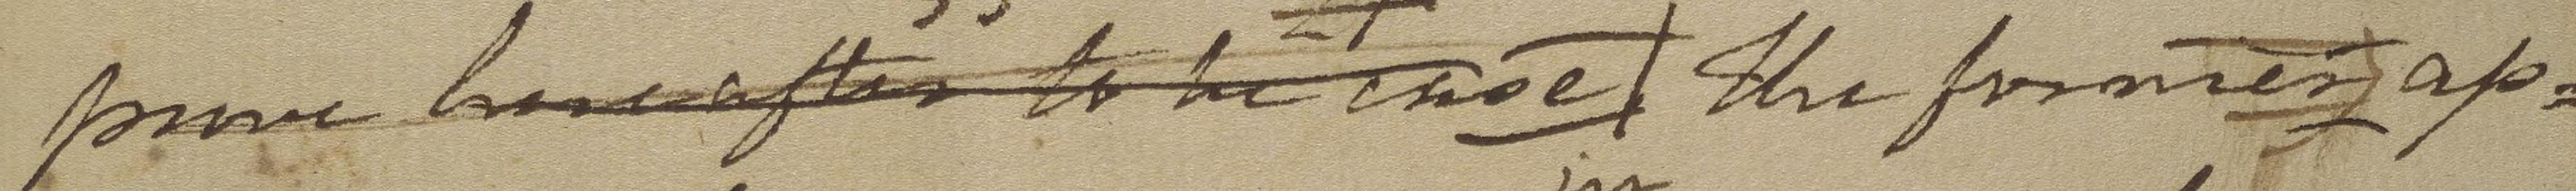prove hereafter to be case) The former) ap-
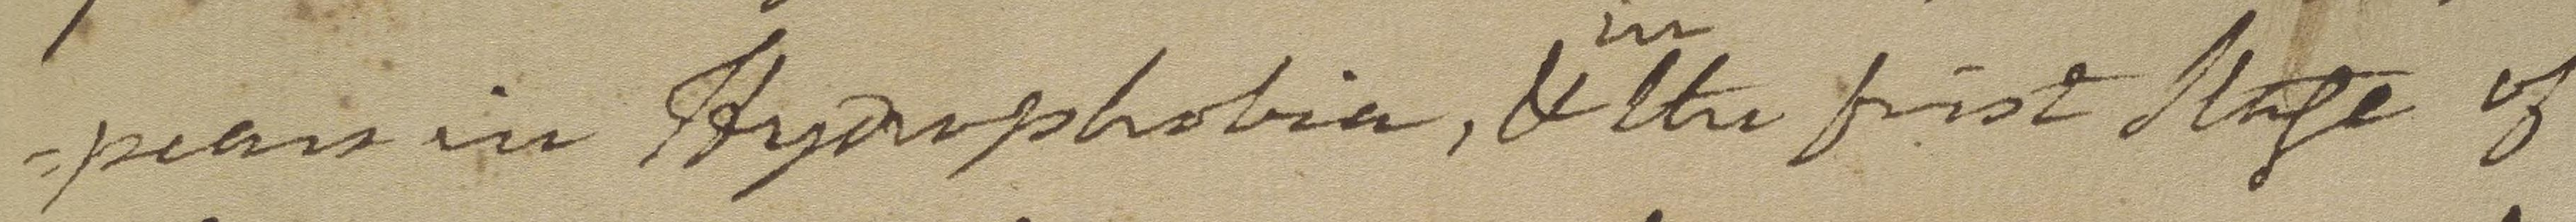-pears in Hydrophobia, & in the first stage of
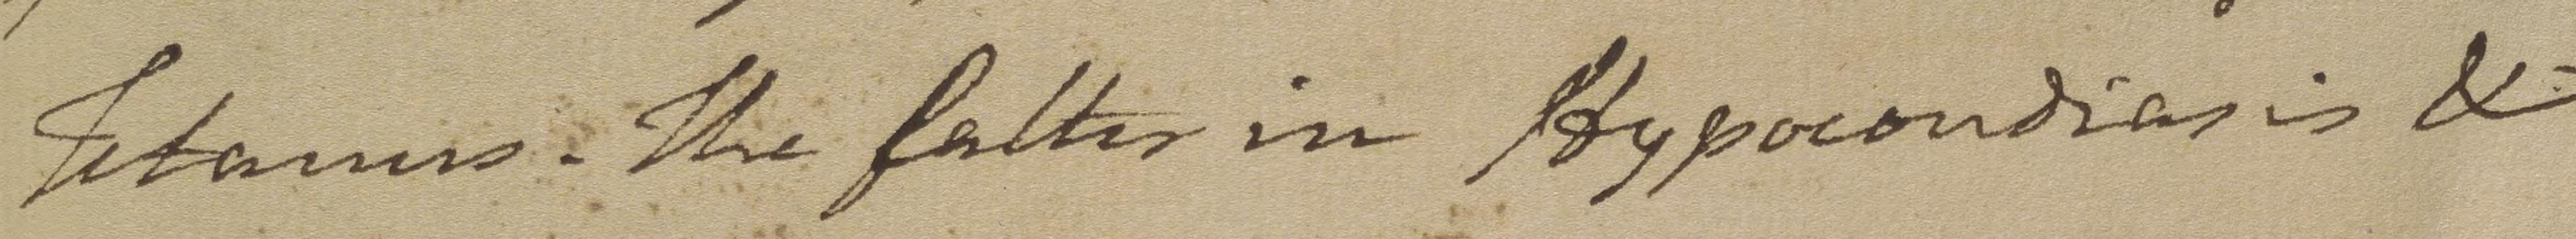Tetanus. The latter in Hypocondriasis &
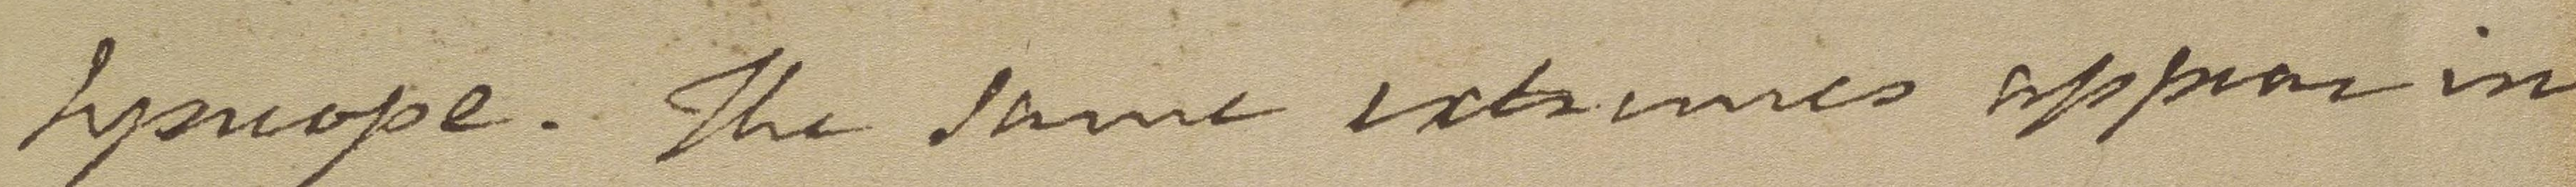syncope. The same extremes appear in
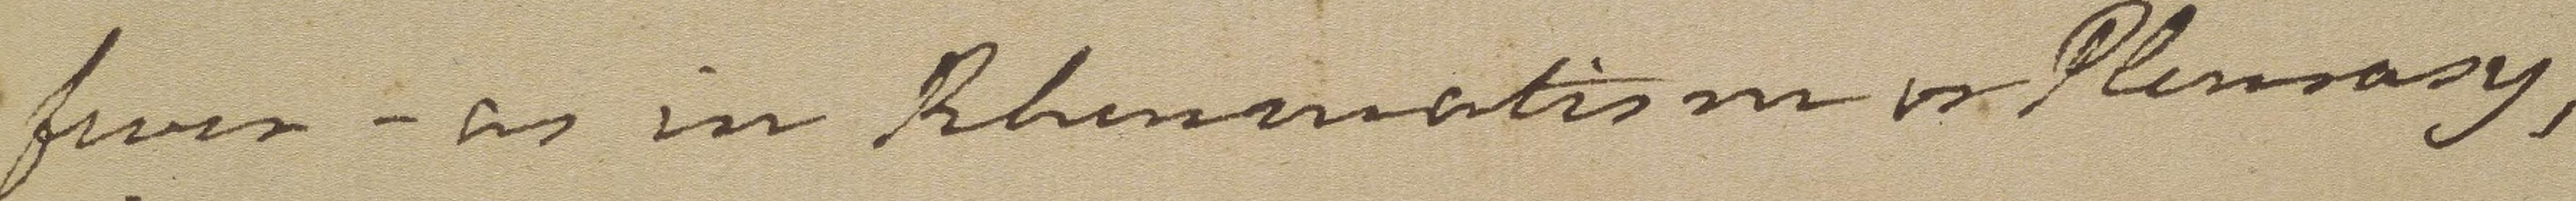fever, as in Rheumatism or Pleurasy
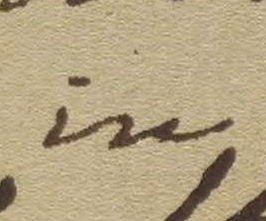in
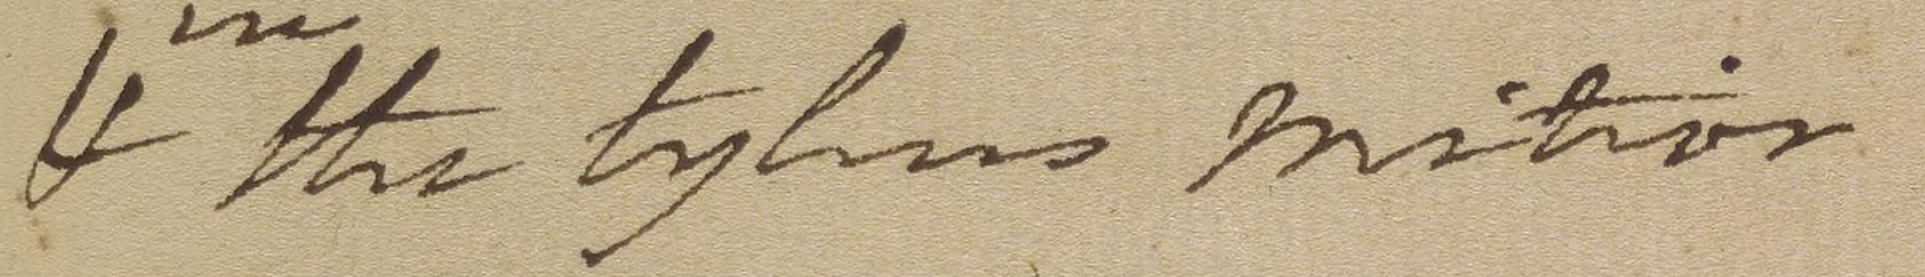& the tylus mitior
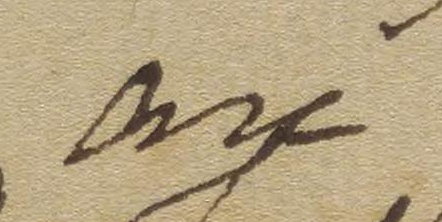are
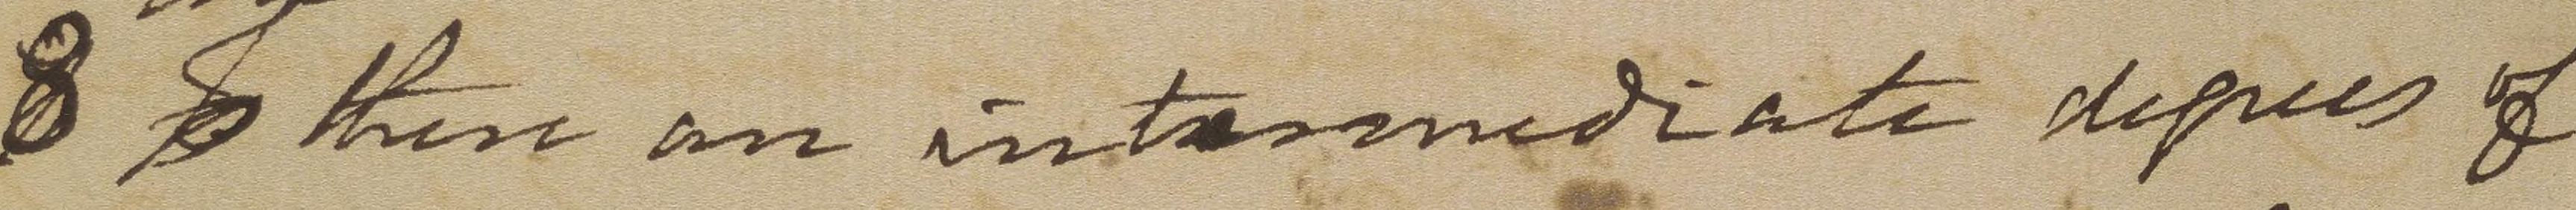3 [Is] there an intermediate degrees of
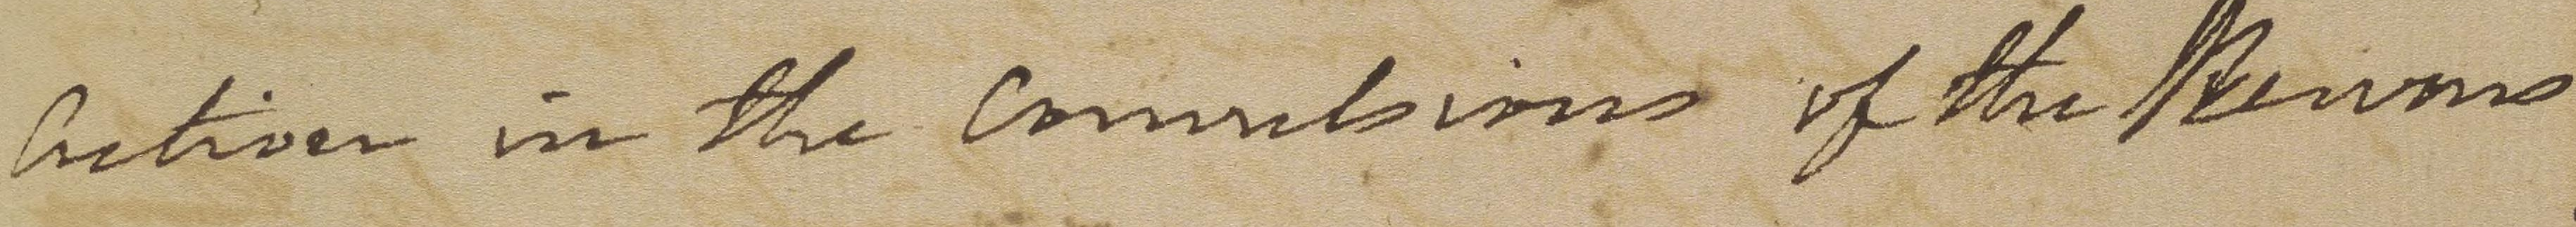action in the convulsions of the Nervous
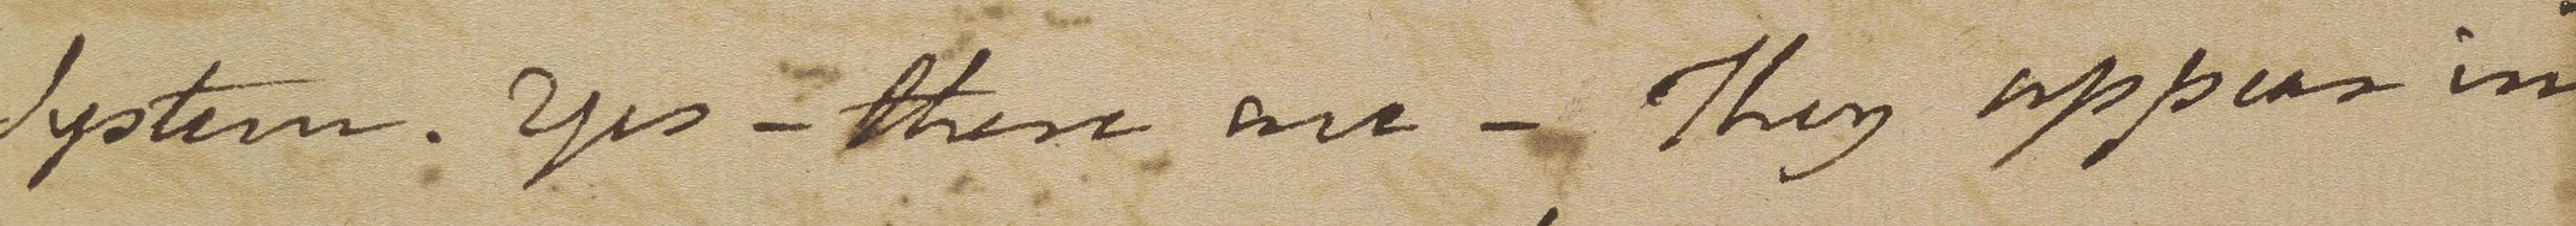system. Yes, there are. They appear in
